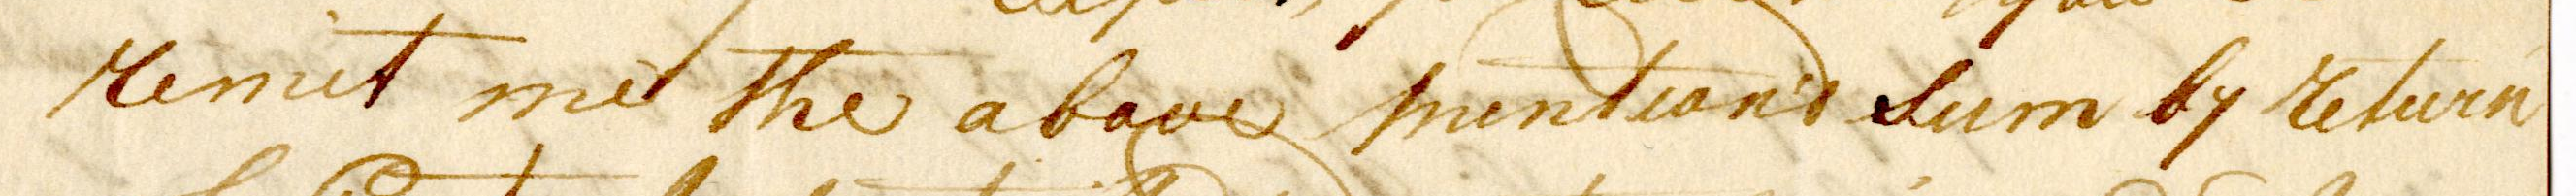rmit me the above mention'd sum by return
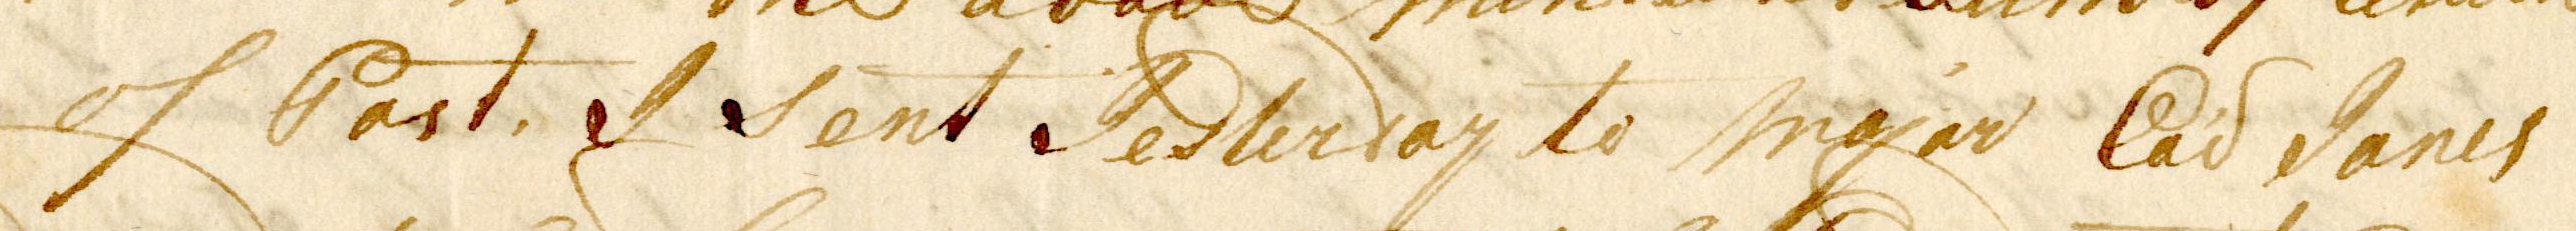of Post. I Sent yesterday to inquir Cad Jones
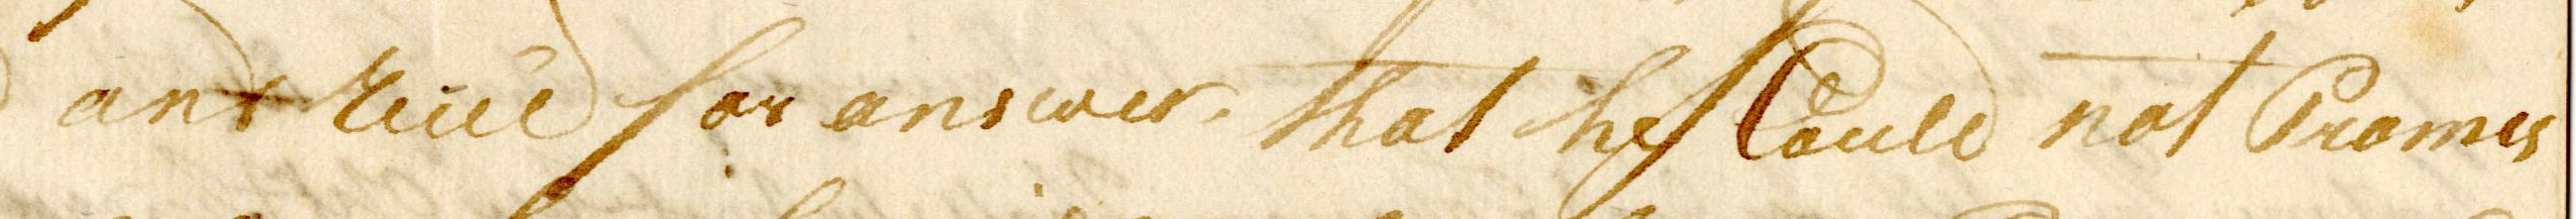and rec^e for answer that he Could not Promes
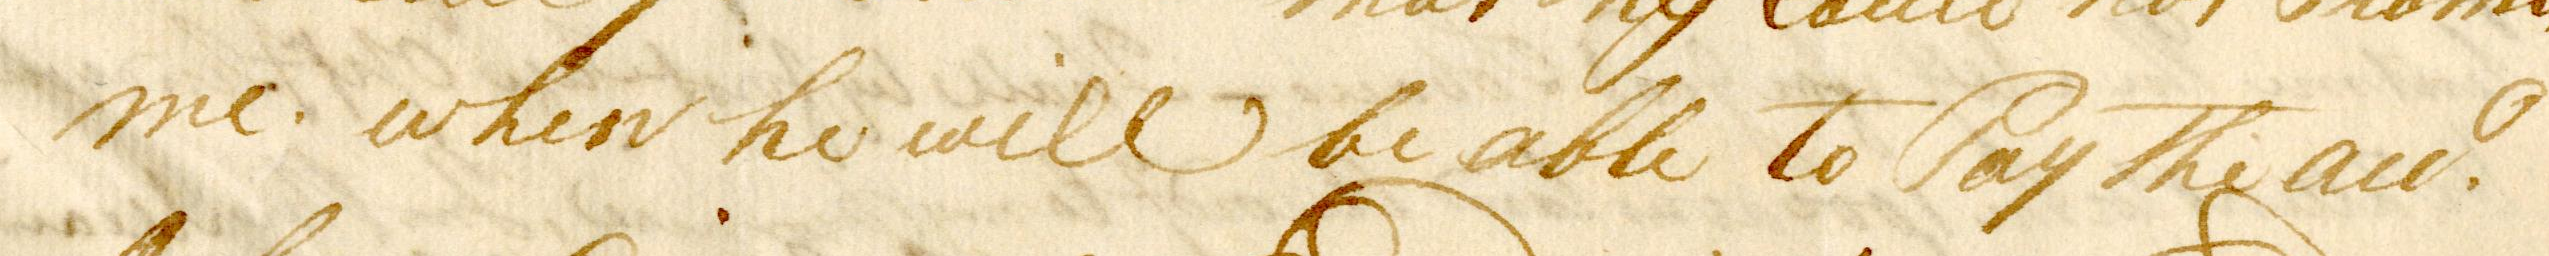me when he will be able to Pay the acc^t.
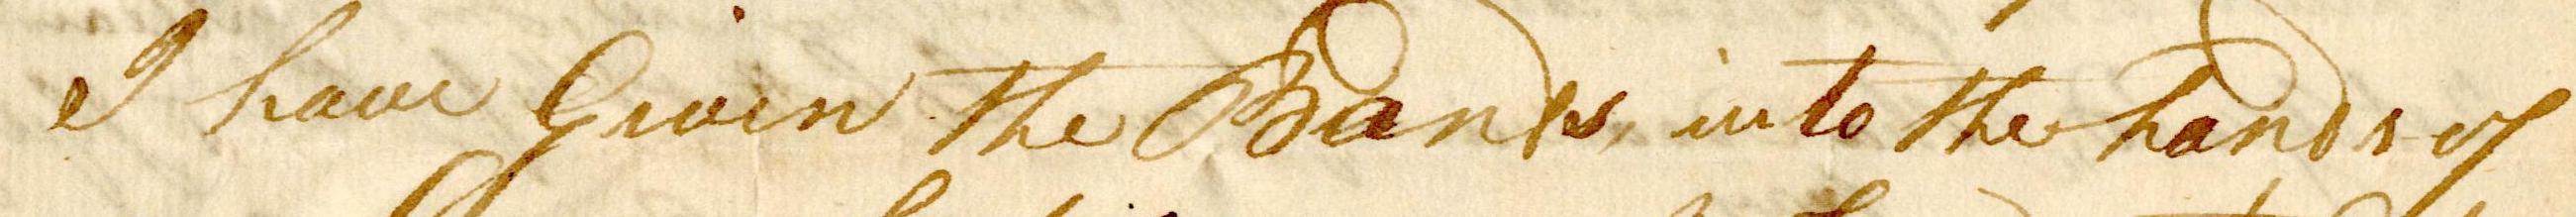I have Given the Bonds, into the hands of
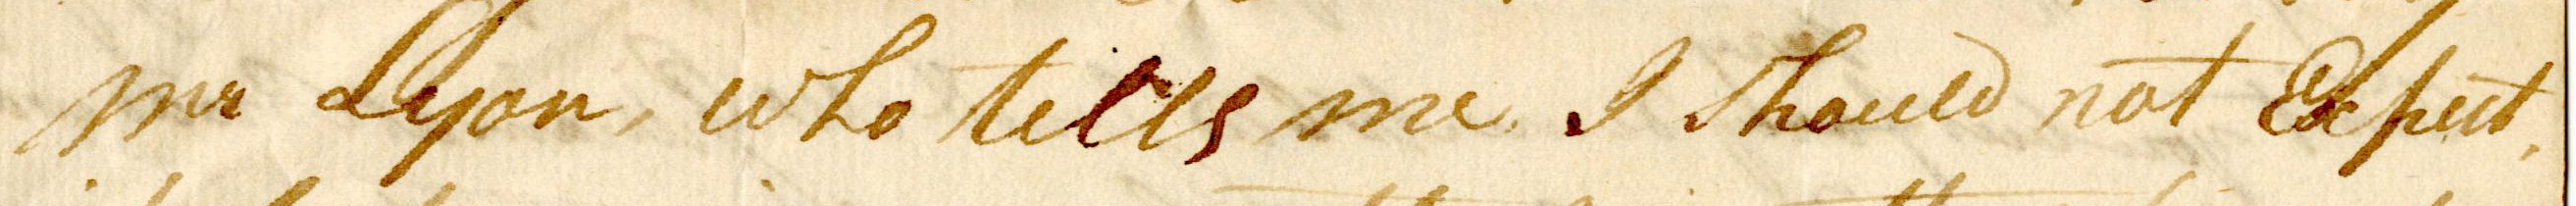M^r Lyon, who tells me, I should not Expect
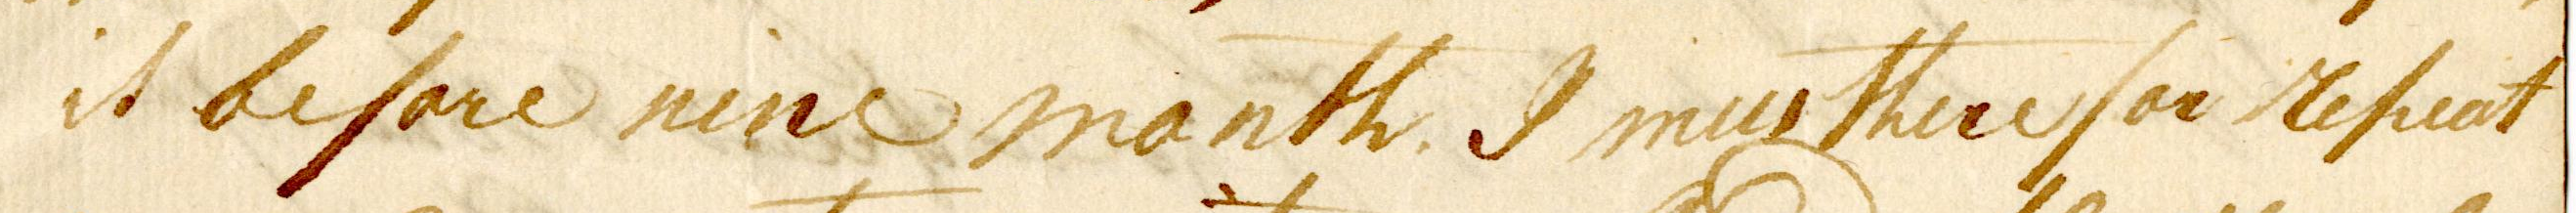it before nine month. I must therefor repeat
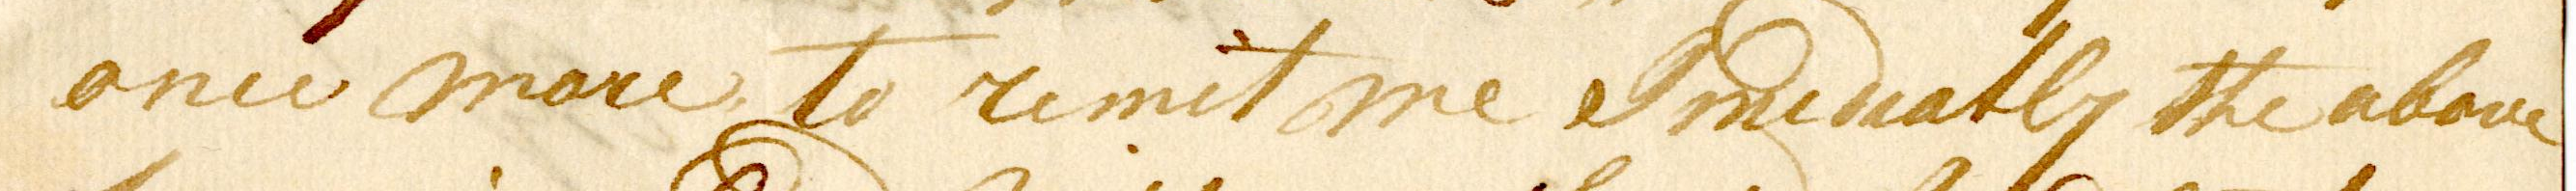once more to remit me Imediatly the above
